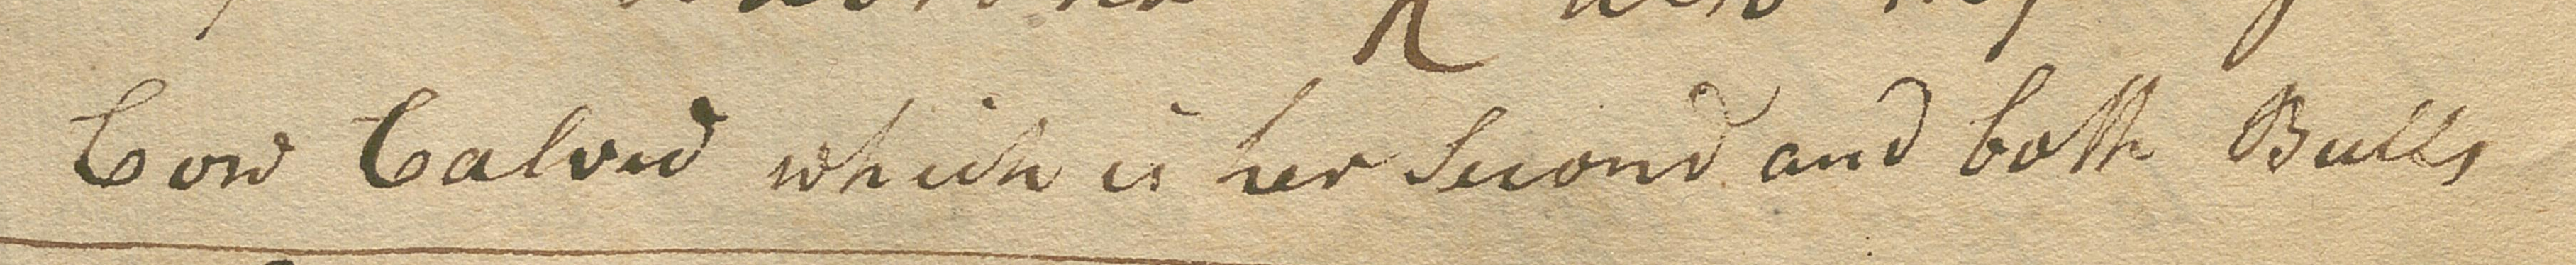Cow Calved which is her second and both Bulls
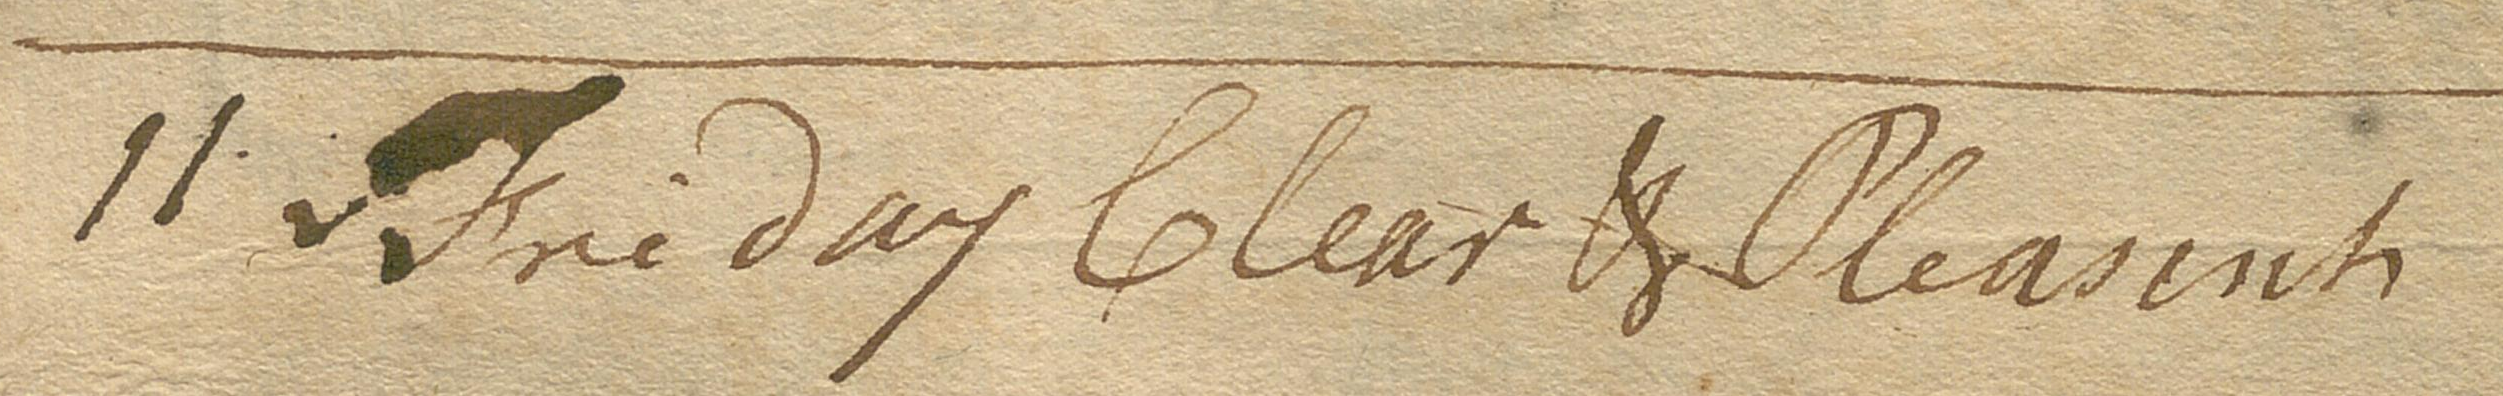11 Friday Clear & Pleasent
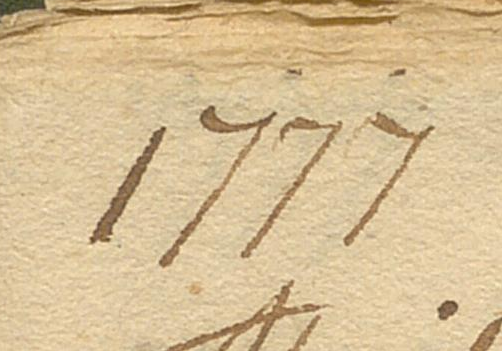1777
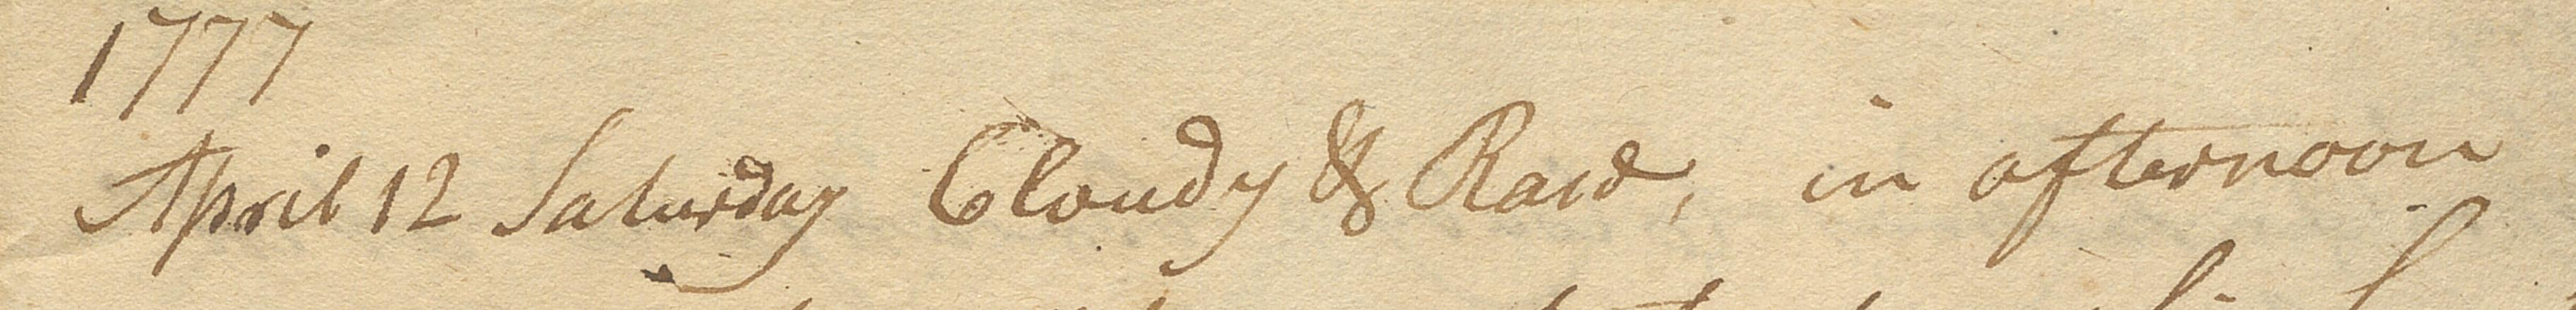April 12 Saturday Cloudy & Raw, in afternoon
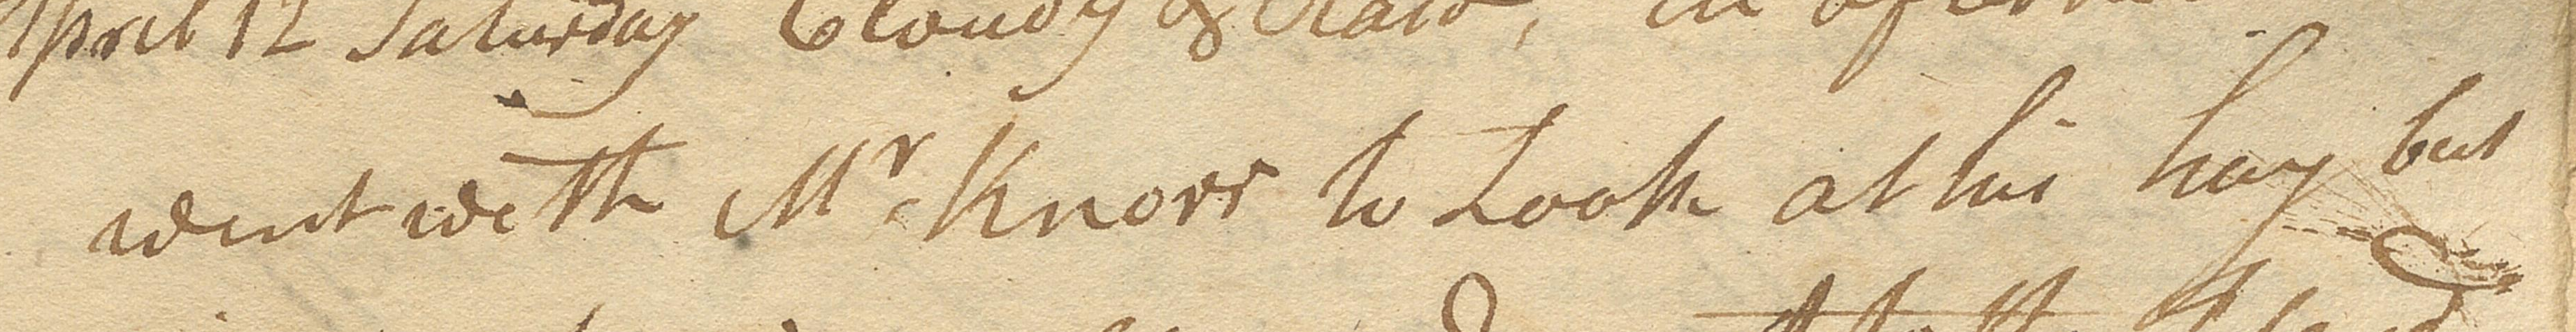went with M^r. Knorr to Look at his hay but
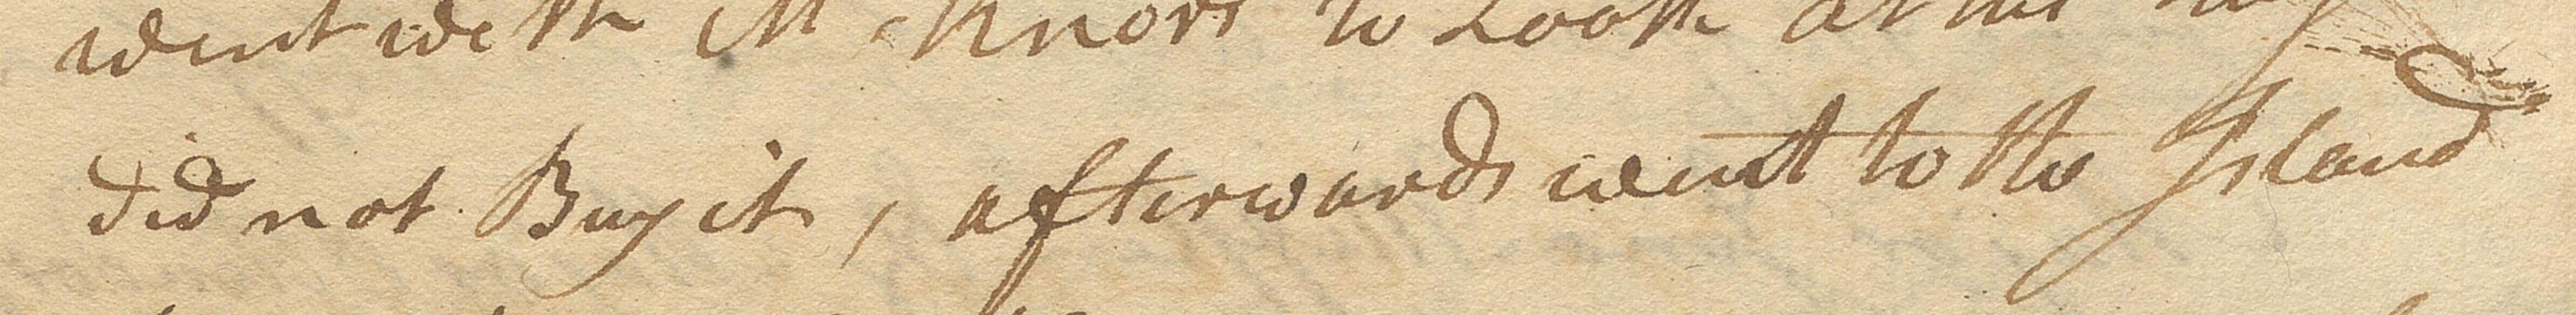did not Buy it, afterwards went to to Island
